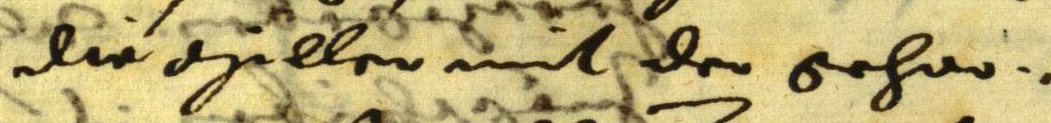die Miller mit den gehor¬
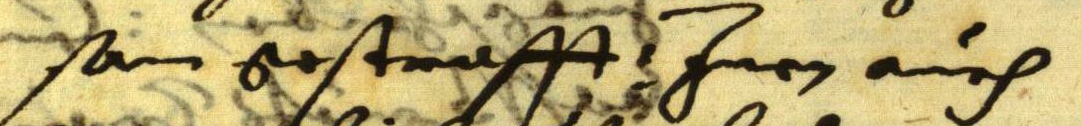sam gestrafft. Inen aūch
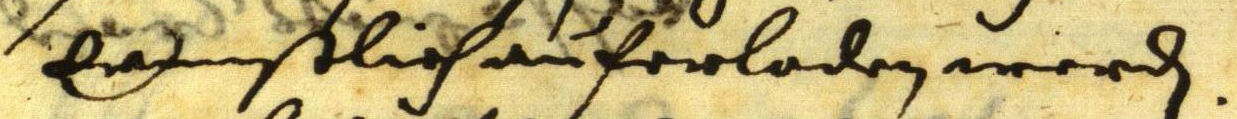Ernnstlich aūferladen werd.
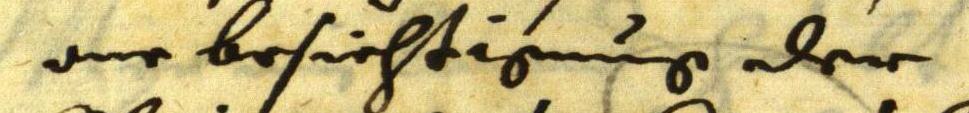one besichtigūng der
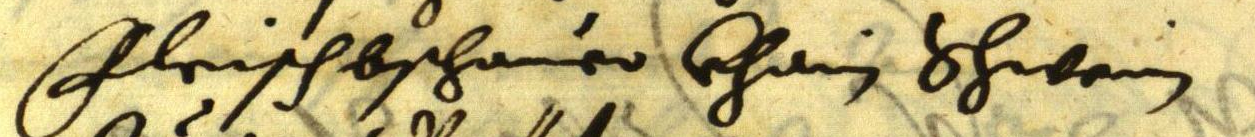Fleischbschaūer khain Schwein
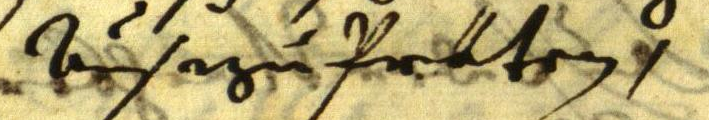AūszūPräten,
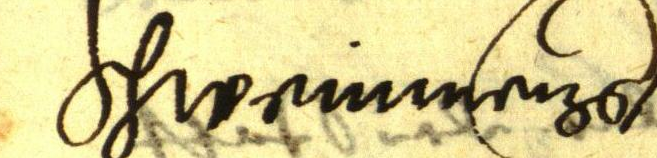Schweinmezg
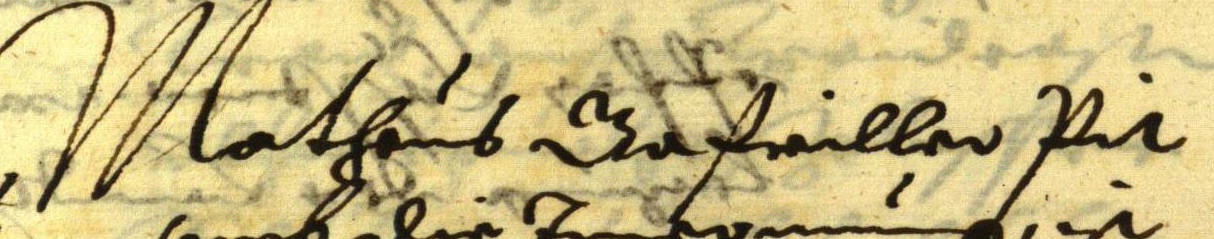Matheūs Gafriller Pit
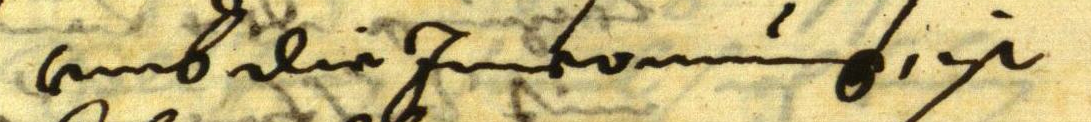vmb die Inwnnūng, ist
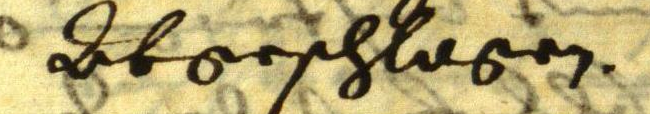Abgeschlagen.
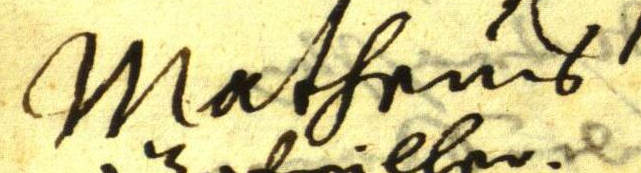Matheūs
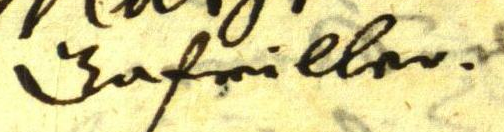Gafriller.
